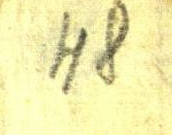48
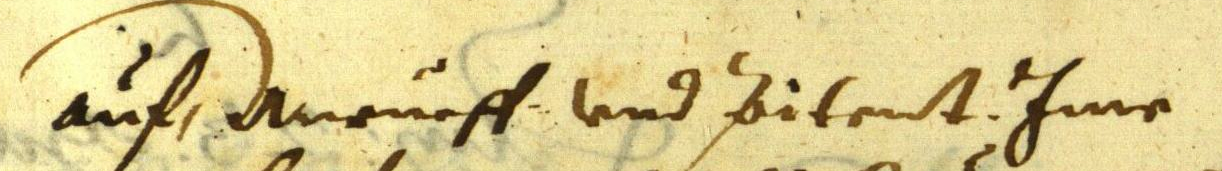aūf, Anrūeff vnd Pitent. Ime
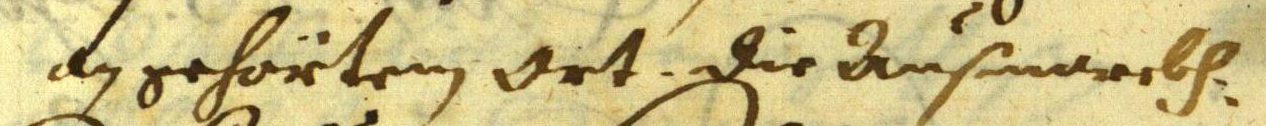an gehörtem Ort. die Aūsmarckh¬
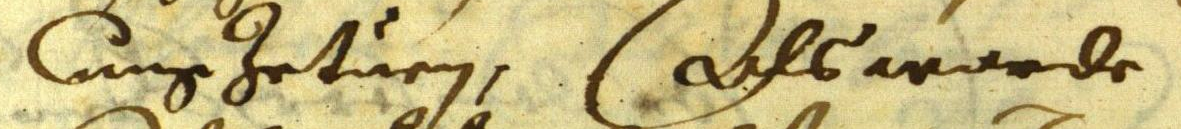ūng Zetūen, Als werde
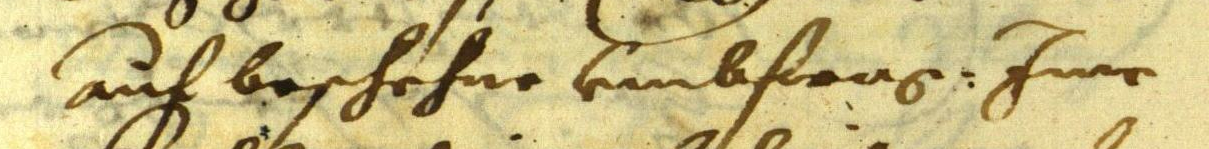aūf beschehen umbfrag. Ime
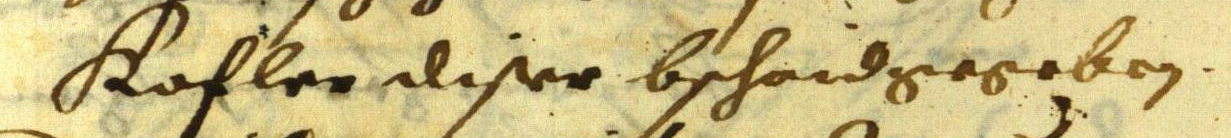Kofler dieser bschaid gegeben.
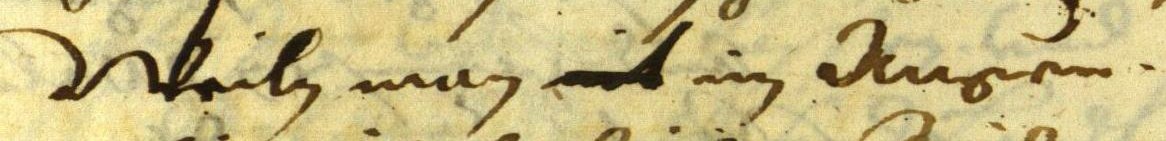Weiln man mit im Aūgen¬
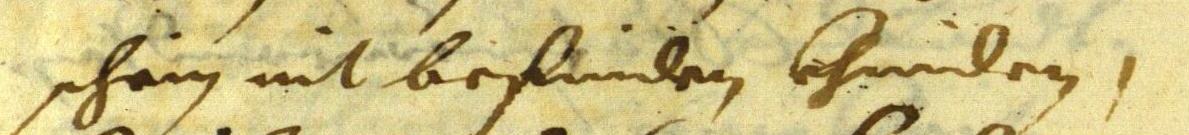schein nit befinden khinden,
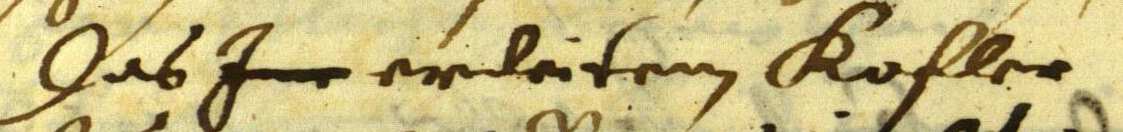das Ime erleitem Kofler
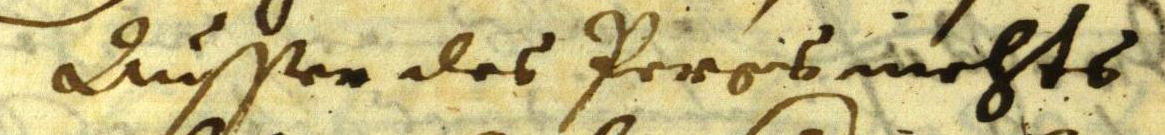Aūsser des Pergis nichts
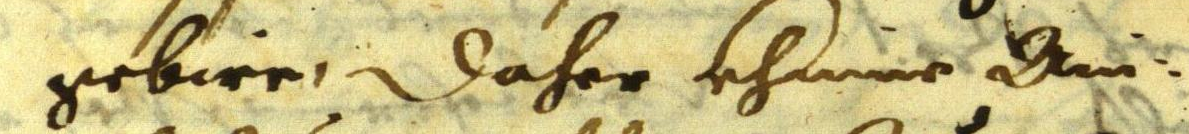gebire, Daher khaine Ain¬
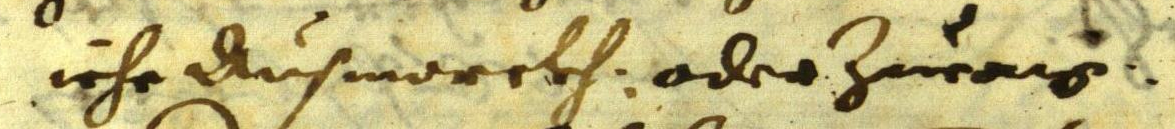iche Aūsmarckh: oder Zūeaig¬
